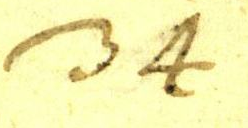34
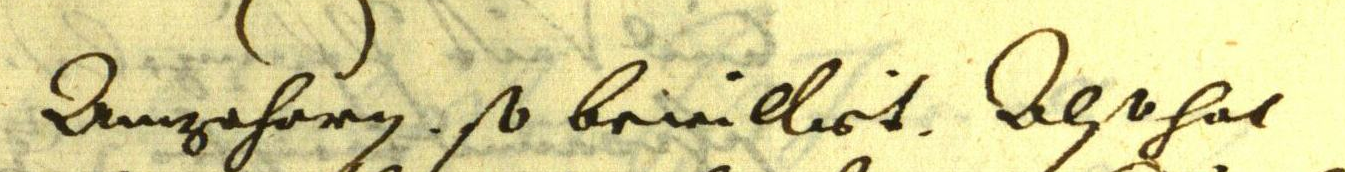Anzehōrn. so bewilligt. Also hat
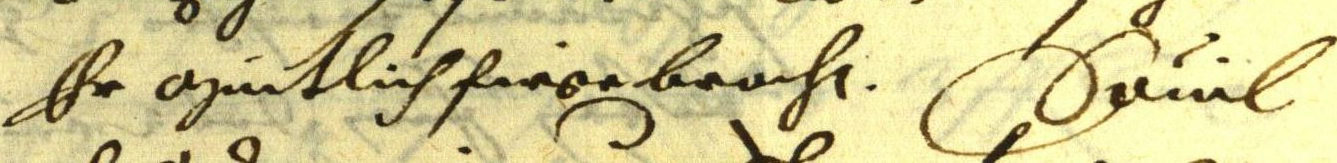Er Mintlich firgebracht. Soūil
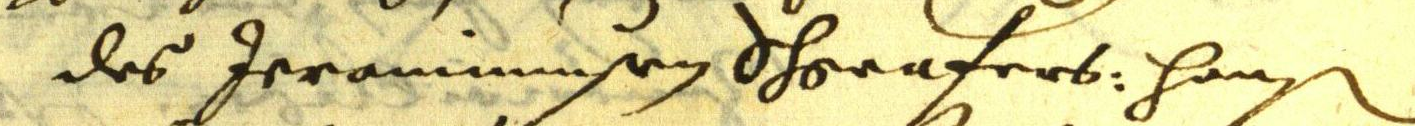Des Jeronimūsen Schgrafers: hans
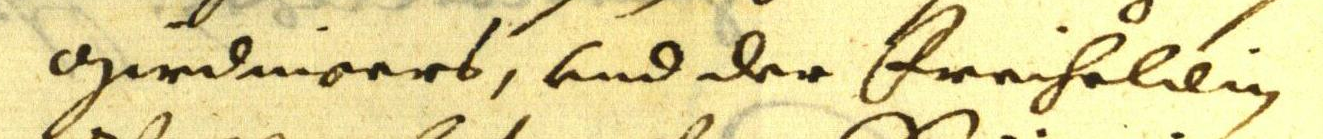Mirdingers, vnd der Freiheldin
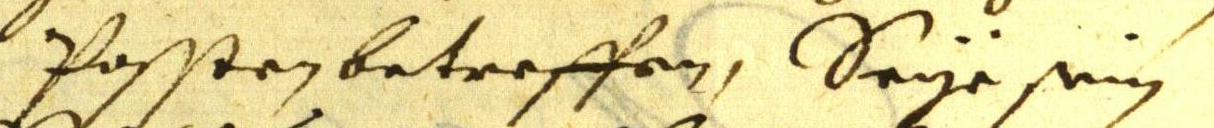Possten betreffen, Seÿe sein
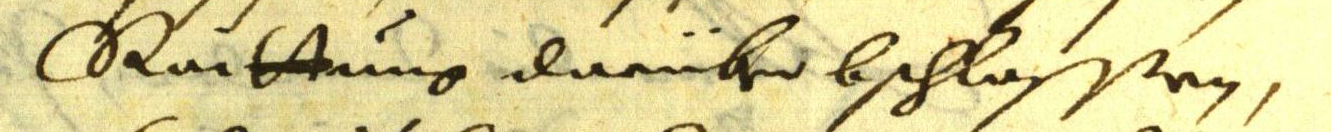Raittūng darüber bschlossen,
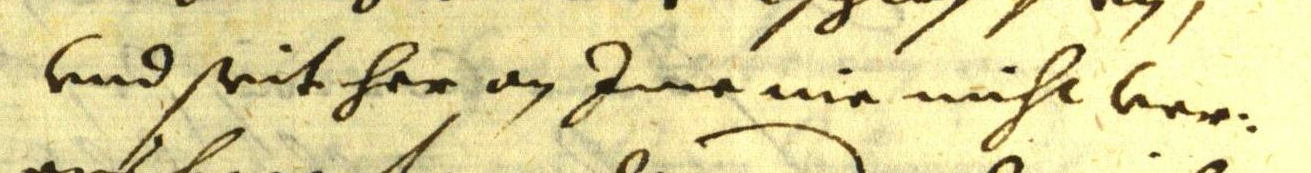vnd seit her an Ime nie nicht ver¬
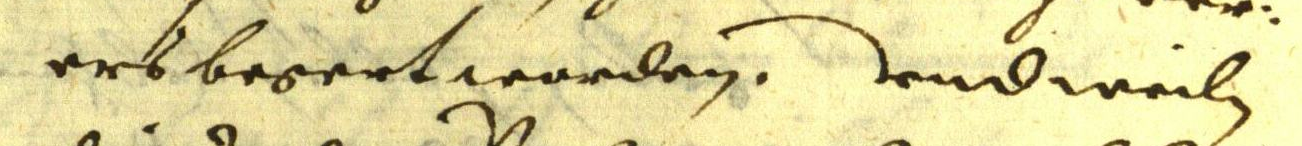ers begert worden. Vnd weiln
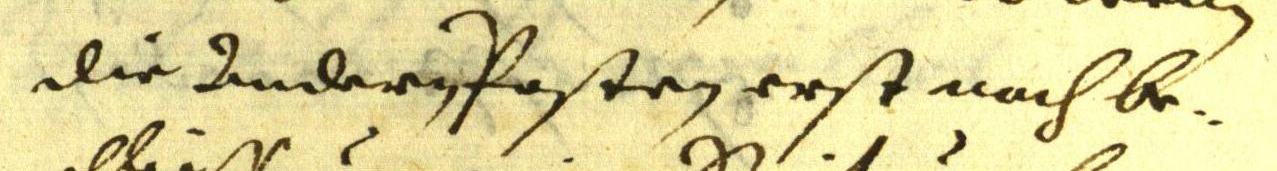die Andern Posten erst nach be¬
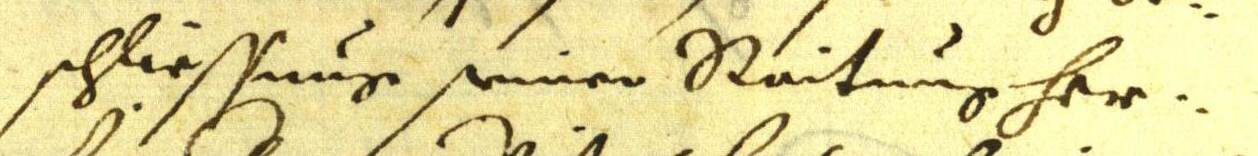schliessūng seiner Raitūng her¬
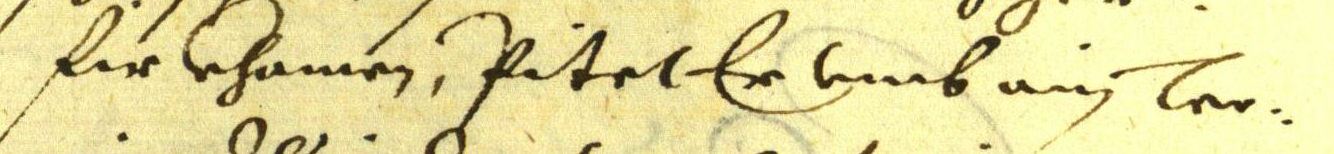fir khomen, Pitet Er vmb ain Ter¬
